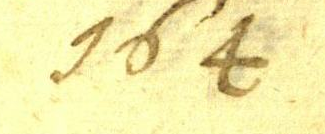164
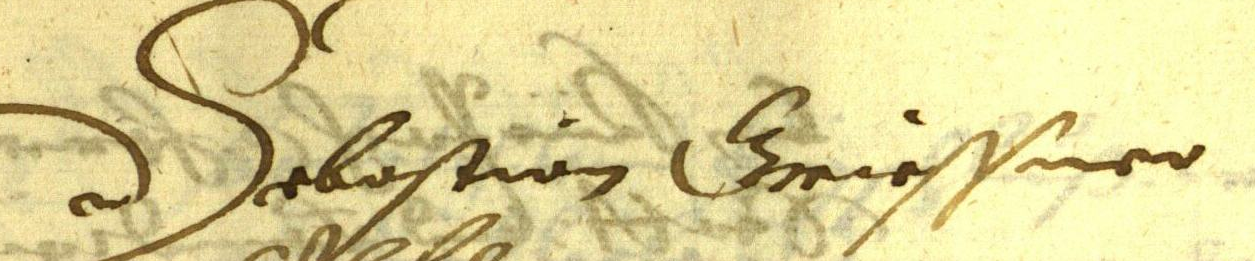Sebastian Griessner
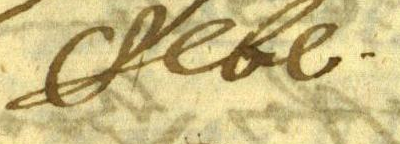Elbl.
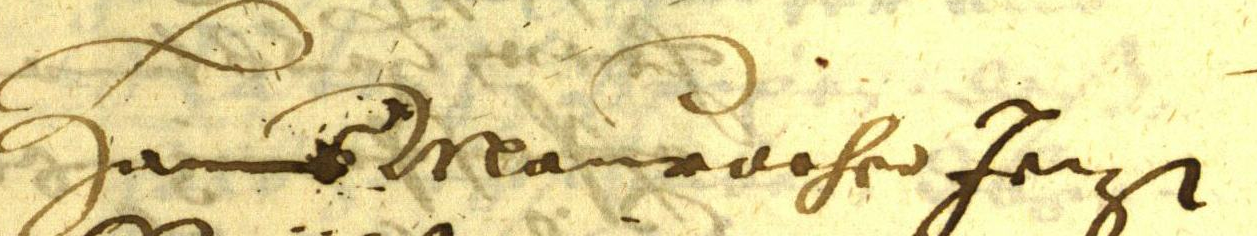Hanns Maūracher Jezt
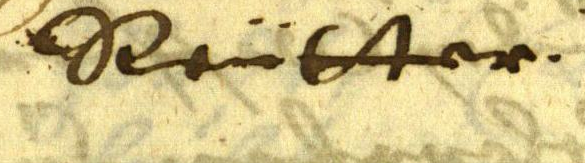Reütter.
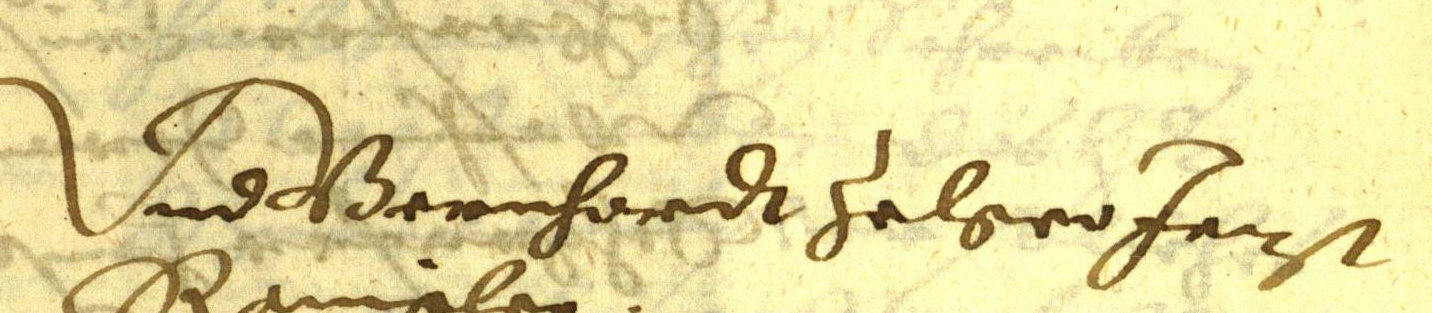Vnd Bernhardt Zelger Jezt
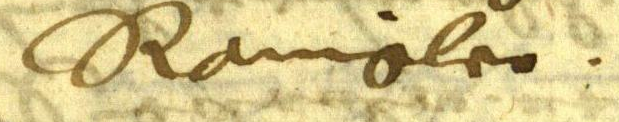Ranigler.
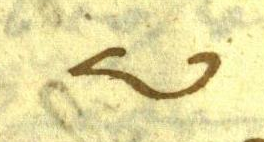t
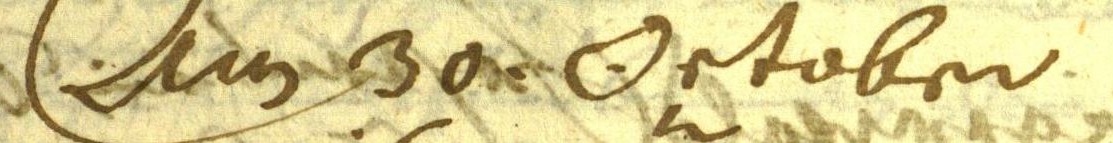Am 30. October
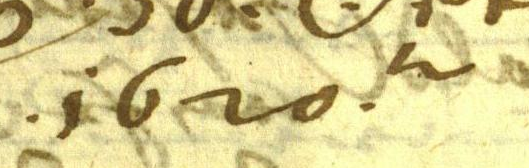.1620.t
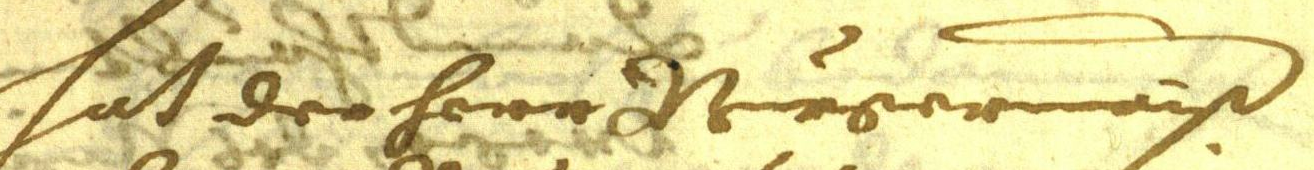hat der herr Būrgermaist
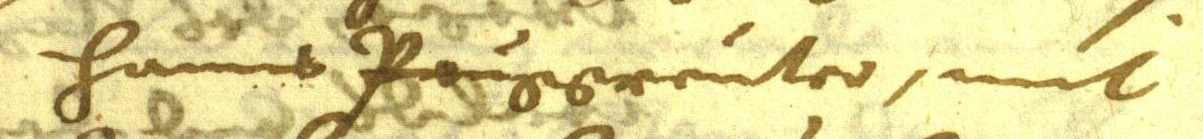hanns Prūggreūter, mit
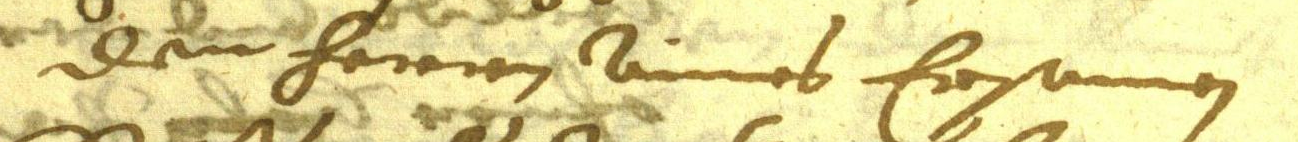den herrn Aines Ersamen
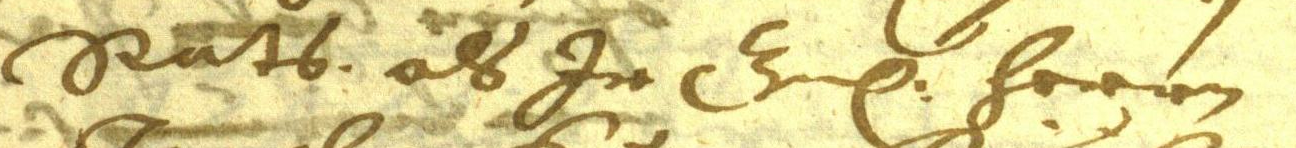Rats. als Ir Gn: herrn
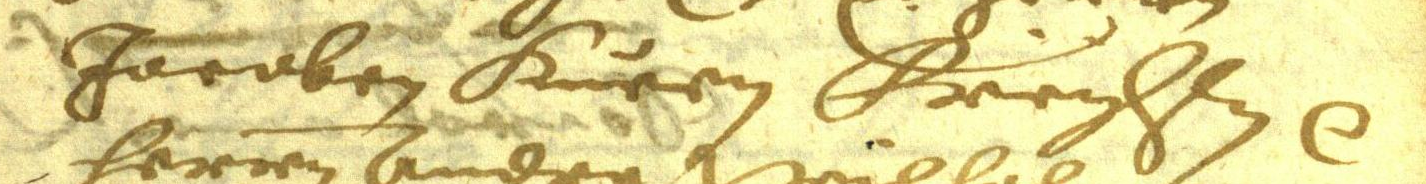Jacoben Kūeen Freÿhn etc
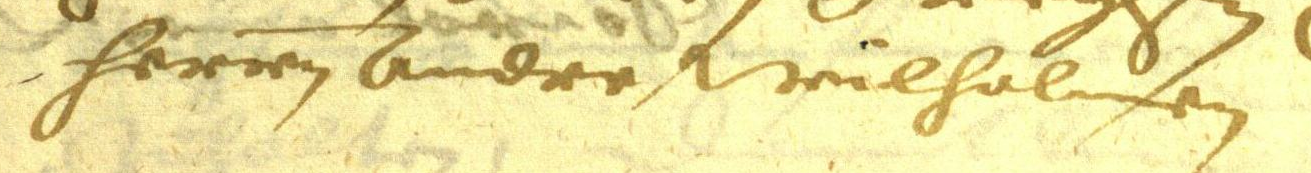herrn Andre Wilhalmen
